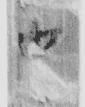中
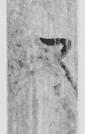父
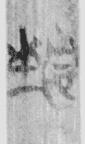埶
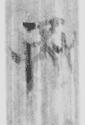承
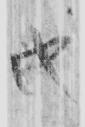女
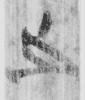之
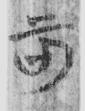可
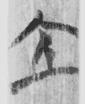立
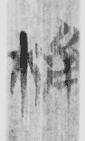{木甫}
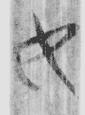女
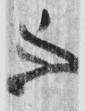之
